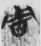周
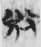敓
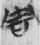周
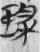○（瑶）
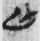㠯（以）
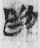○（廷）
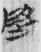阩
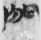門
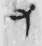又
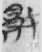敗
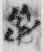忻
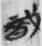戠
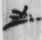之
